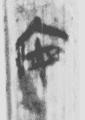{宀母}
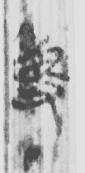尃
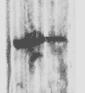一
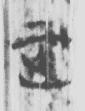正
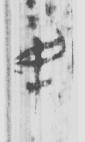民
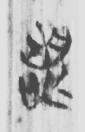若
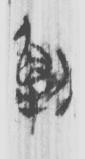解
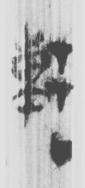凍
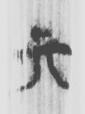亓
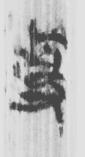史
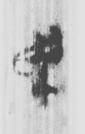民
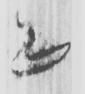㠯（以）
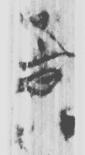{屮日}
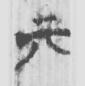亓
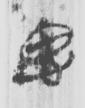思
